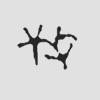攼
